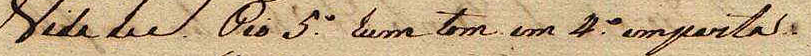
Vida de S Pio 5o. hum tom em 4o. em pazta
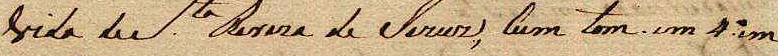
Vida de Sta. Thereza de Iezus, hum tom em 4o. em
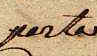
pazta
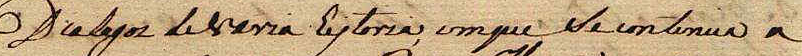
Dialogoz de Varia historia, em que se continua a
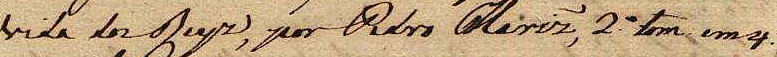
vida dos Reyz, por Pedro Mariz̄, 2o. tom em 4o.
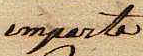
em pazta
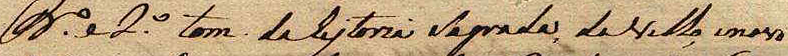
Pro. e 2o. tom da historia Sagrada do Velho, e novo
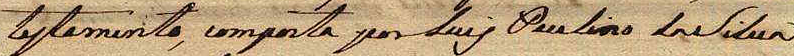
testamento, composta por Luis Paulino da Silua
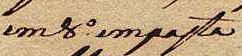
em 8o. em pasta
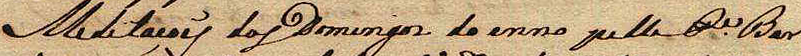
Meditações dos Domingos do anno pello Pe. Bar
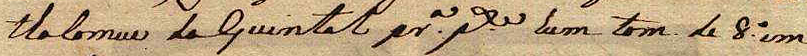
tholomeu do Quintal pra. pte. hum tom de 8o. em
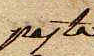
pasta
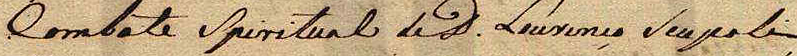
Combate Spiritual de D. Lourenço Scupoli
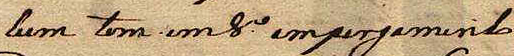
hum tom em 8o. em pergaminho
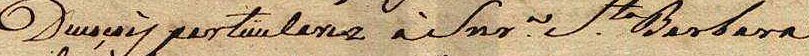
Devoções particulares à Snra. Sta. Barbara
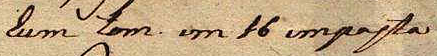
hum tom em 16 em pasta
